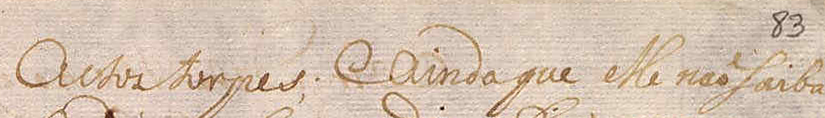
Actos torpes; E Ainda que elle naõ saiba
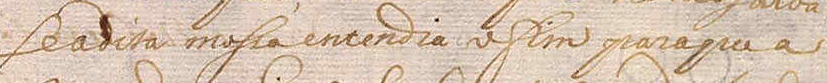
se a dita mossa entendia a fim para que a
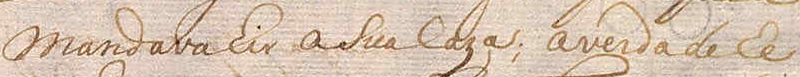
mandava hir a sua Caza, a verdade he
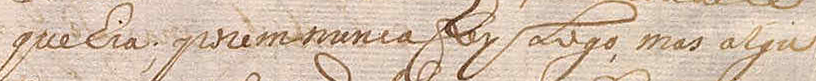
que hia; porem nunca foy Logo, mas algu
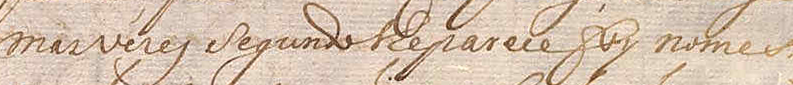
mas vezes segundo lhe parece foy no mes
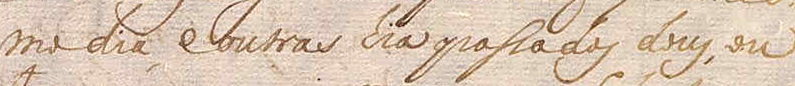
mo dia, e outras hia passados dous, ou
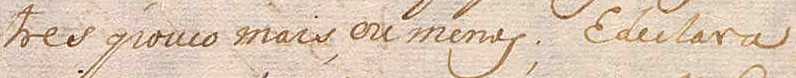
tres pouco mais ou menos; E declara
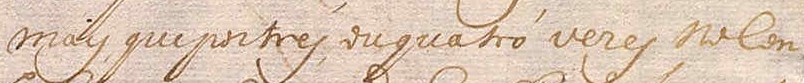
mais, que por tres, ou quatro vezes no Con
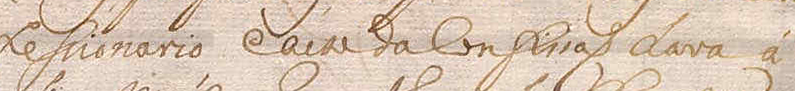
fessionario, e acto da Confissaõ dava á
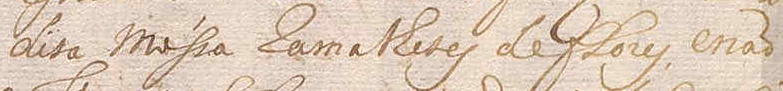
dita mossa Ramalhetes de flores, e naõ
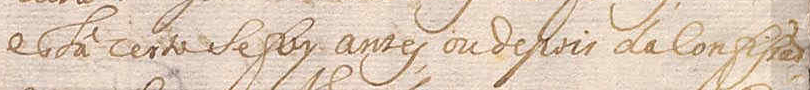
estâ certo se foy antes, ou depois da Confissão
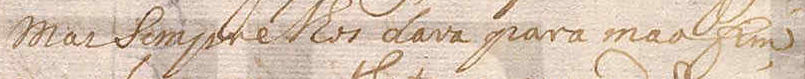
mas sempre lhos dava para mao fim
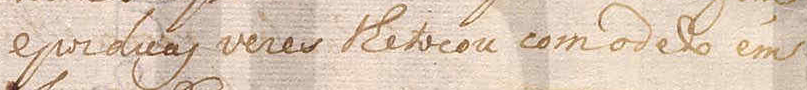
e por duas vezes lhe tocou com o dedo em
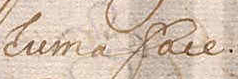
huma face.
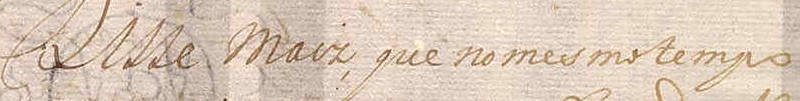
Disse maiz, que no mesmo tempo
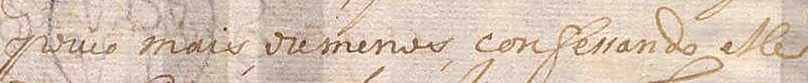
pouco mais, ou menos, confessando elle
